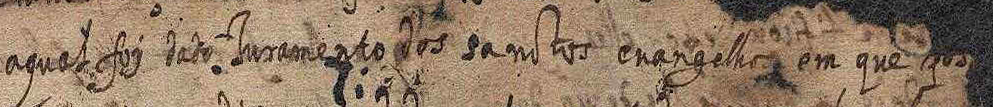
a qual foy dado Juramento dos sanctos euangelhos em que pos
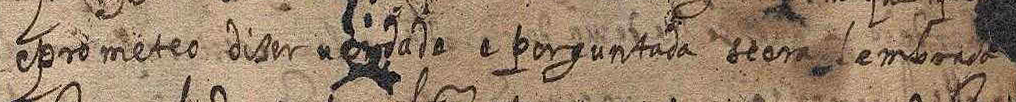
e prometeo dizer uerdade e perguntada se era lembrada
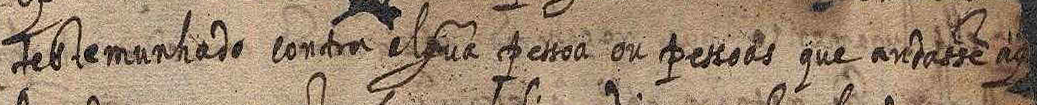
testemunhado contra algūa pessoa ou pessoas que andassē ap
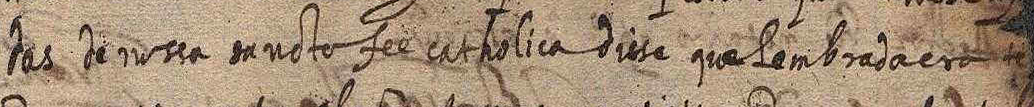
das de nossa sancta fee catholica disse que lembrada era te
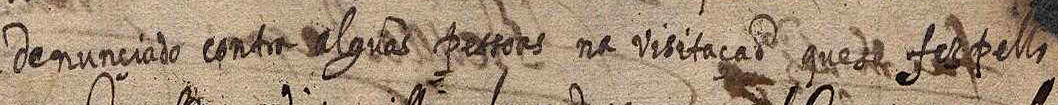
denunçiado contra alguās pessoas na visitaçaõ que se fez pello
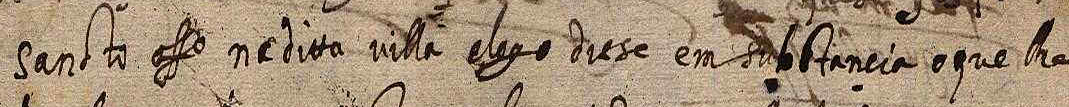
sancto offo na ditta uilla e logo disse em substançia o que lhe
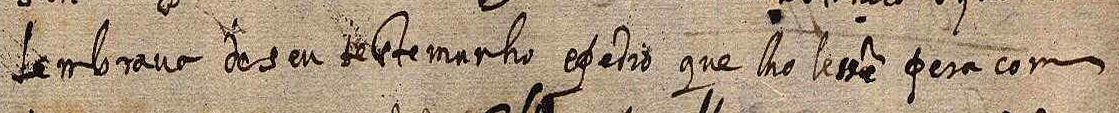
lembraua de seu testemunho e pedio que lho lessē pera com
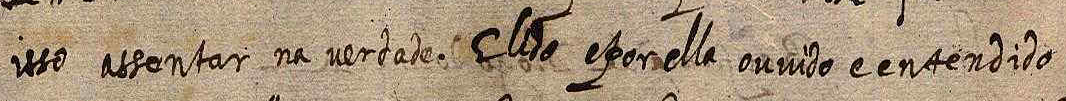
isso assentar na uerdade. E lido e por ella ouuido e entendido
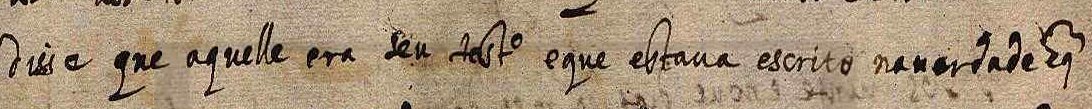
disse que aquelle era seu testo e que estaua escrito na uerdade e q̄
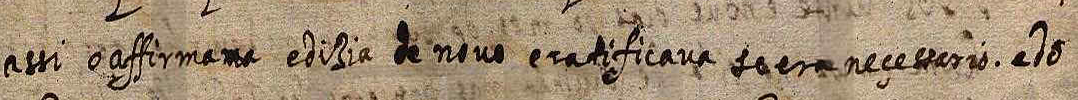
assi o affirmaua e dizia de nouo e ratificaua se era neçessario. e do
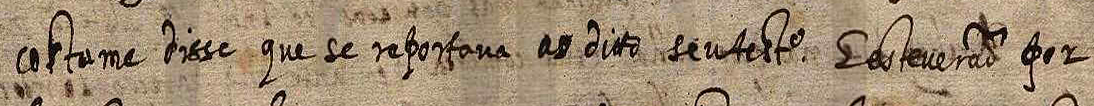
costume disse que se reportaua ao ditto seu testo. E esteuerão por
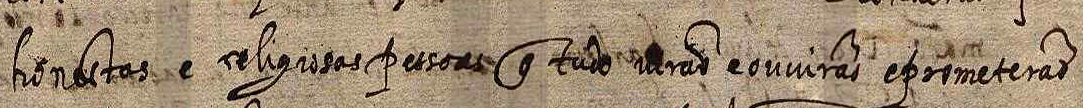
honestas e religiosas pessoas q̄ tudo uiraõ e ouuirão e prometeraõ
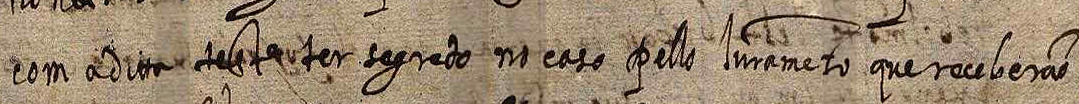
com a ditta testa ter segredo no caso pello Juramēto que receberão
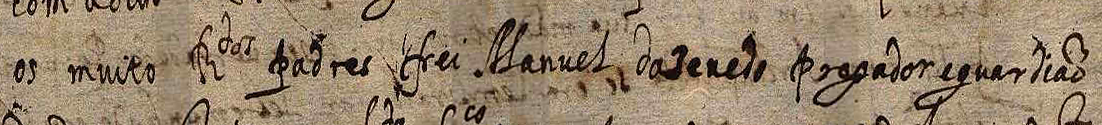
os muito Rdos padres frei Manuel dazeuedo pregador e guardiaõ
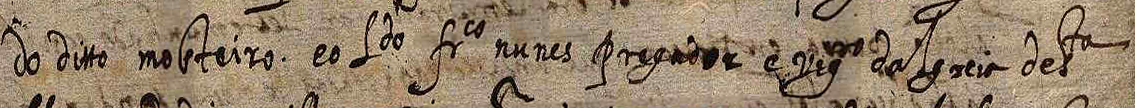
do ditto mosteiro. e o Ldo frco nunes pregador e vigro da Igreia de sta
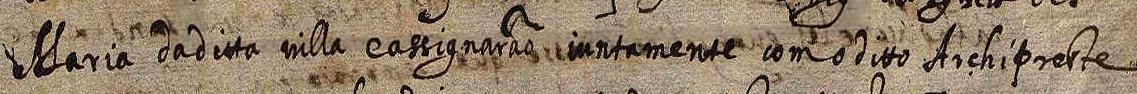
Maria da ditta uilla e assignarão iuntamente com o ditto Archipreste
